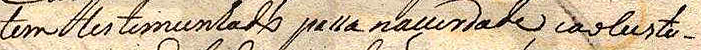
tem testemunhado passa na uerdade, e ao custu
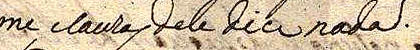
me, e couzas dele dice nada.
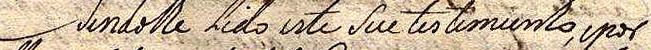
E sendolhe Lido este Seu testemunho, e por
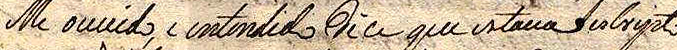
elle ouuido, e entendido dice que estaua esCripto
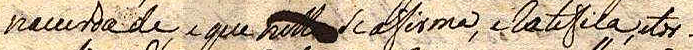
na uerdade, e que nelle se afirma, e Ratifica, e tor
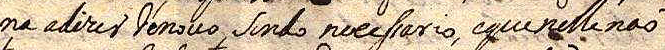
na a dizer de nouo sendo necessario, e que nelle naõ
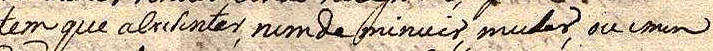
tem que acresentar, nem deminuir, mudar ou emen
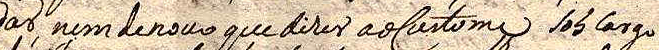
dar, nem de nouo que dizer ao Custume sob cargo
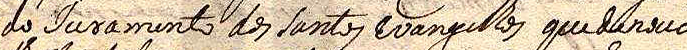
do Juramento dos Santos Evangelhos que de nouo
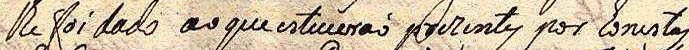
lhe foi dado ao que estiueraõ prezentes por honestas,
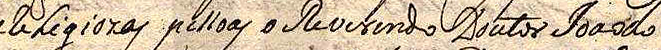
e Religiozas pessoas o Reverendo Doutor Joao do
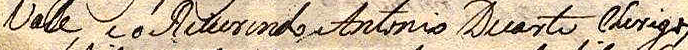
Vale, e o Reuerendo Antonio Duarte Clerigos
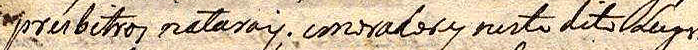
presbitros naturais; e moradores neste dito Lugar.
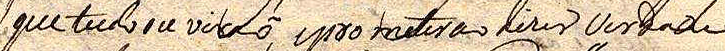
que tudo ouviraõ, e prometerao dizer uerdade
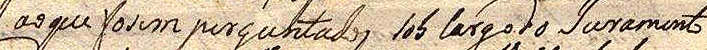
ao que fosem perguntados sob cargo do Juramento
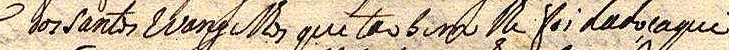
dos santos Evangelhos que taobem lhe foi dado, e aqui
